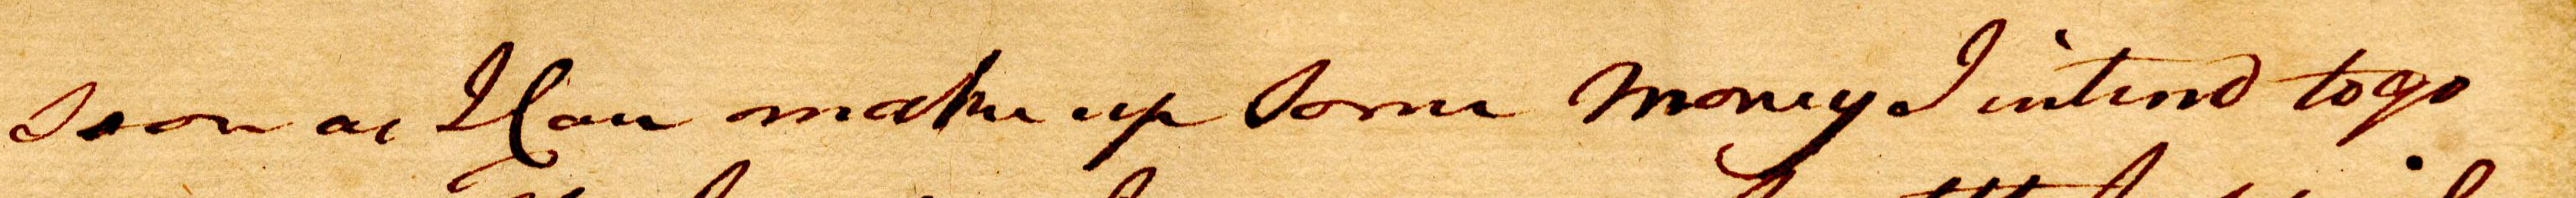soon as I can make up some money I intend to go
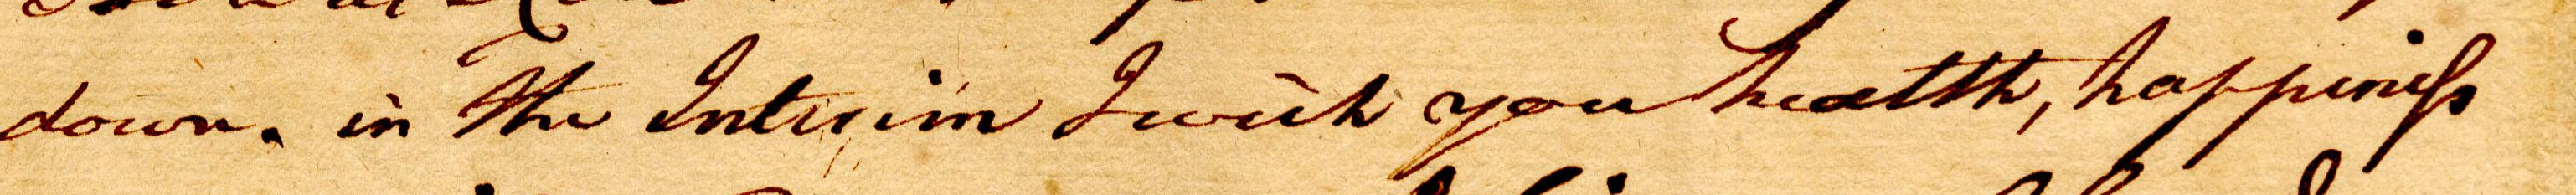down. in the interim I wish you health, happiness
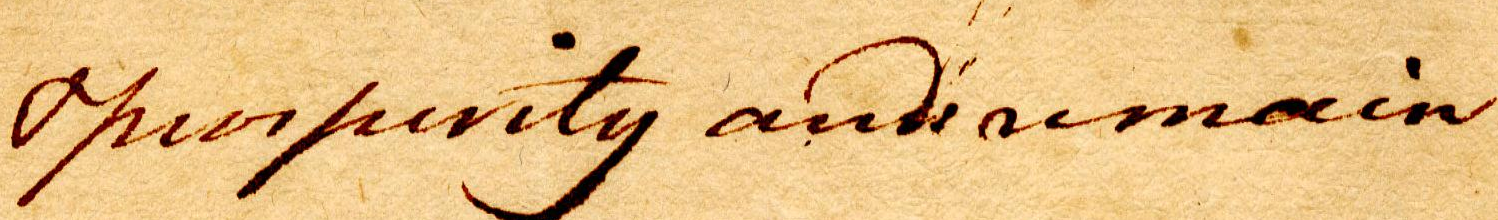& prosperity and remain
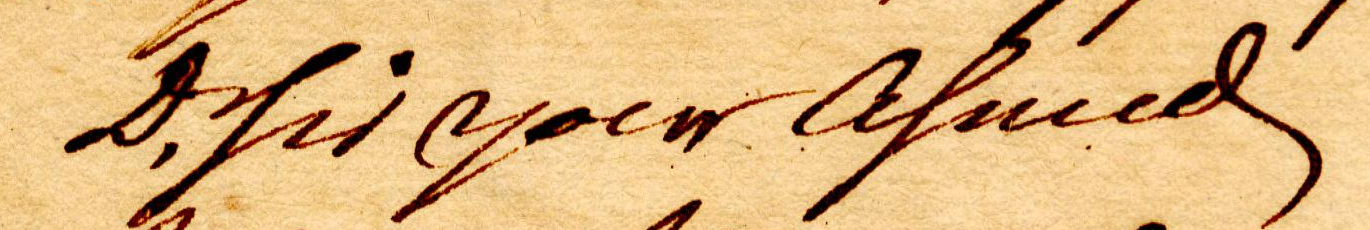D^r. sir your Asured
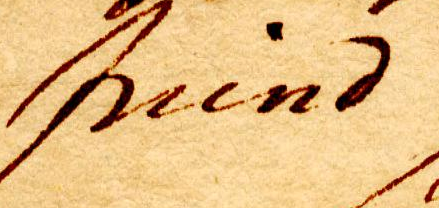Friend
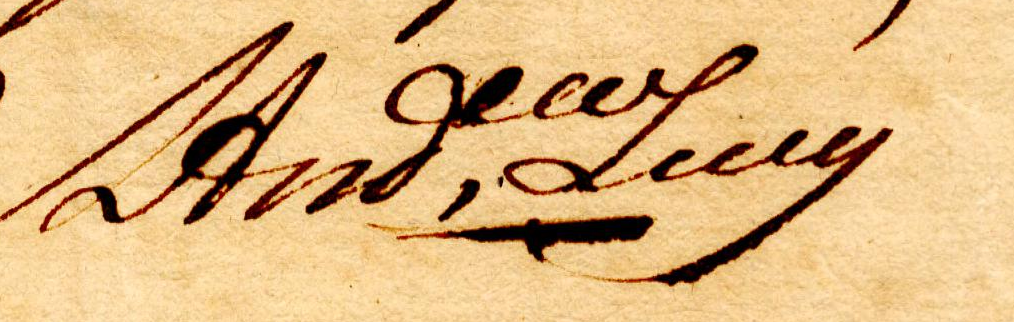And^rew Levy
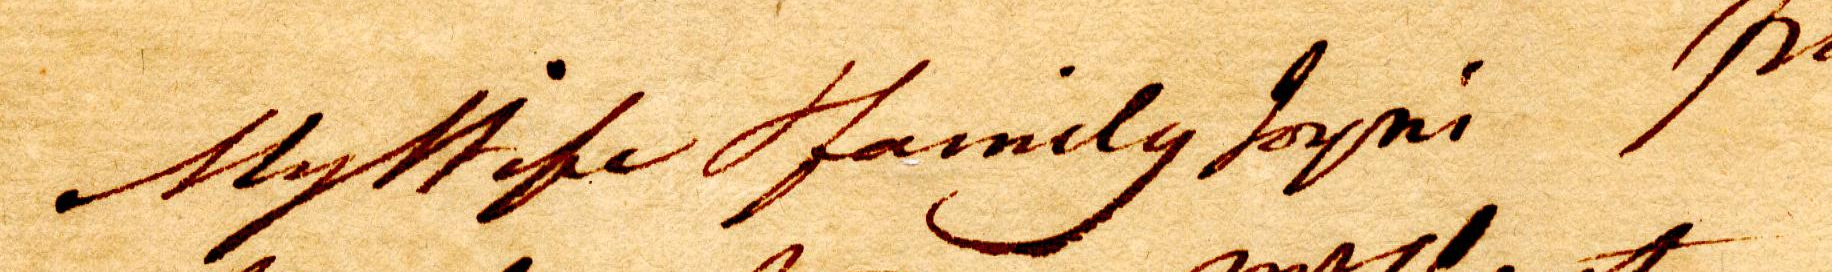My Wife & family Joyn's
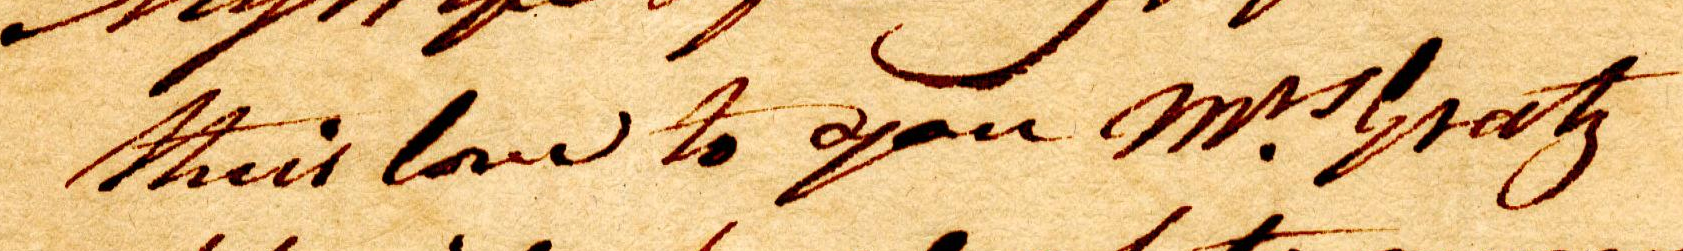their love to you M^rs. Gratz
